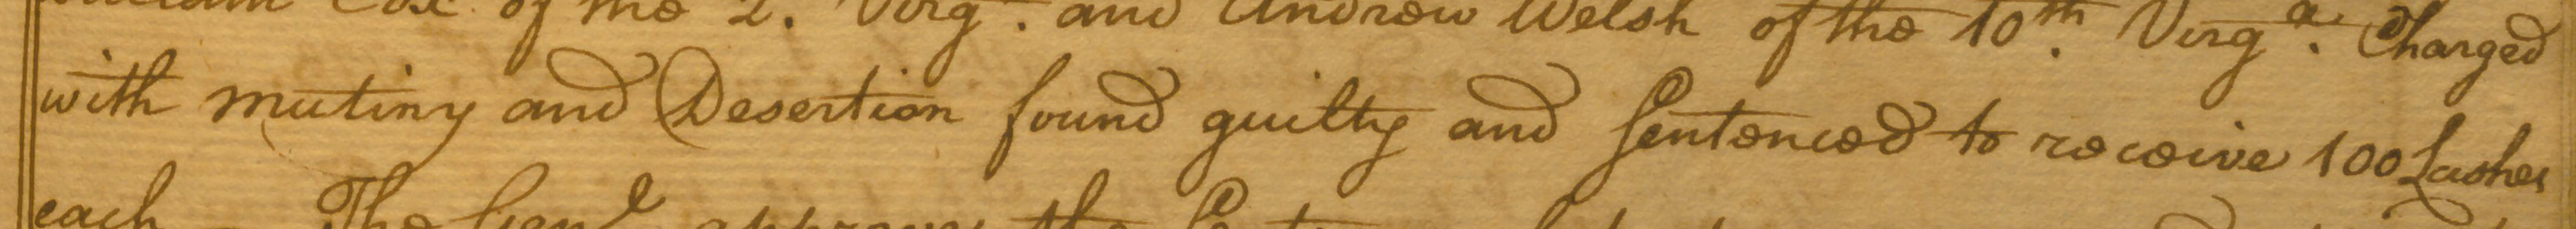with mutiny and Desertion found guilty and sentenced to receive 100 Lashes
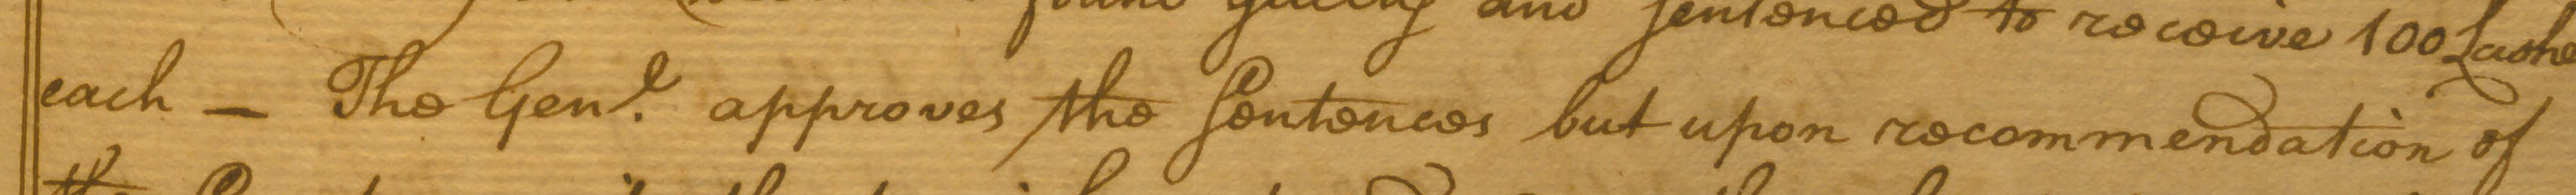each- The Gen^l. approves the sentences but upon recommendation of
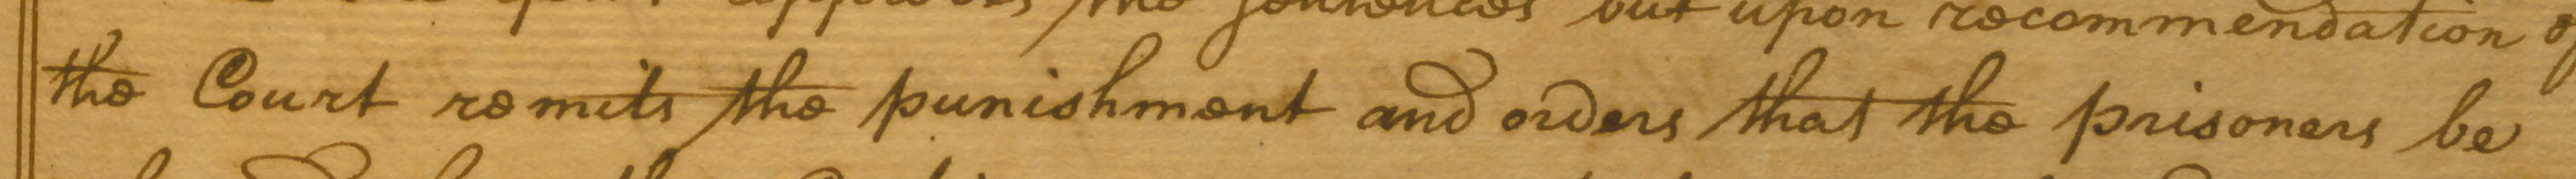the Court remits the punishment and orders that the prisoners be
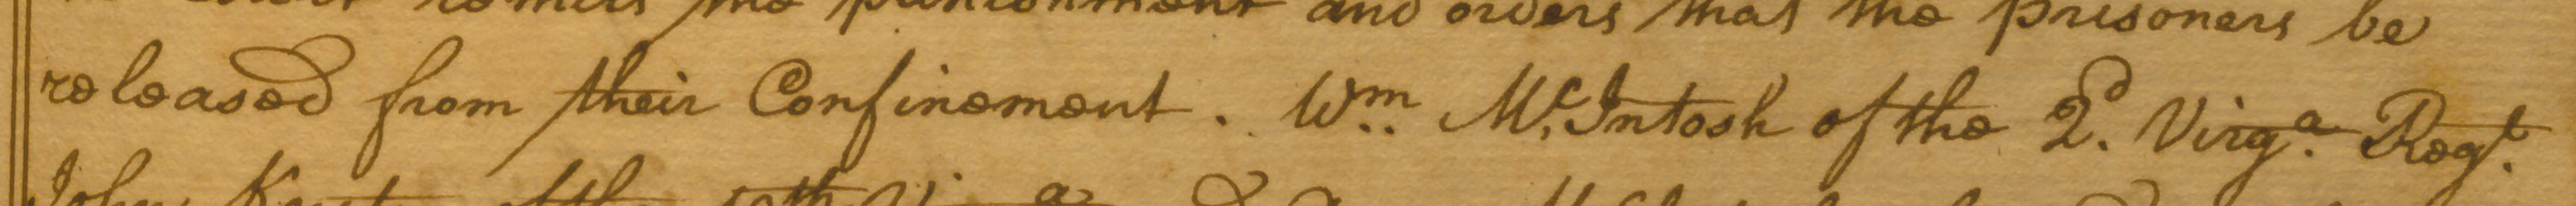released from their Confinement. W^m. M^c.Intosh of the 2^d. Virg^a. Reg^t.
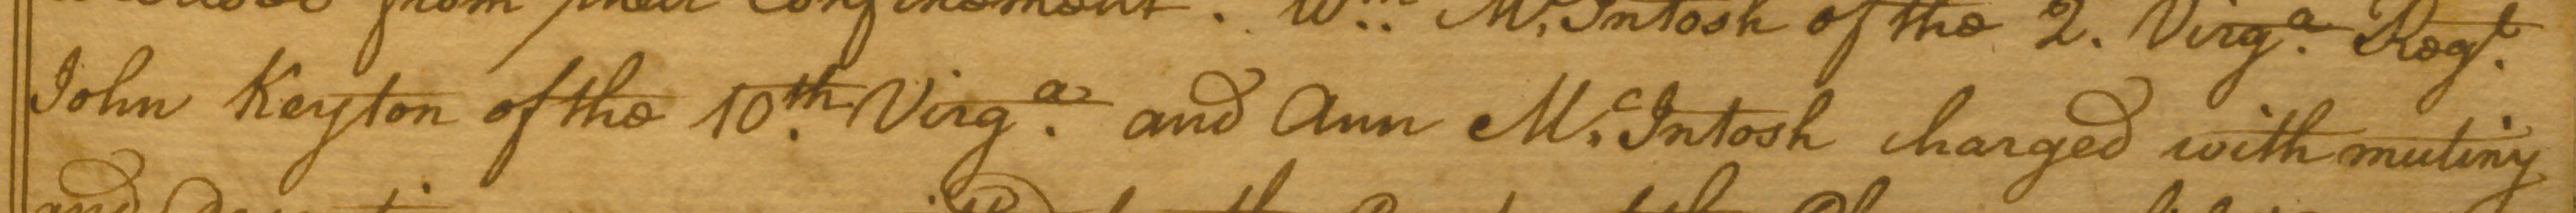John Keyton of the 10^th. Virg^a. and Ann M^c.Intosh charged with mutiny
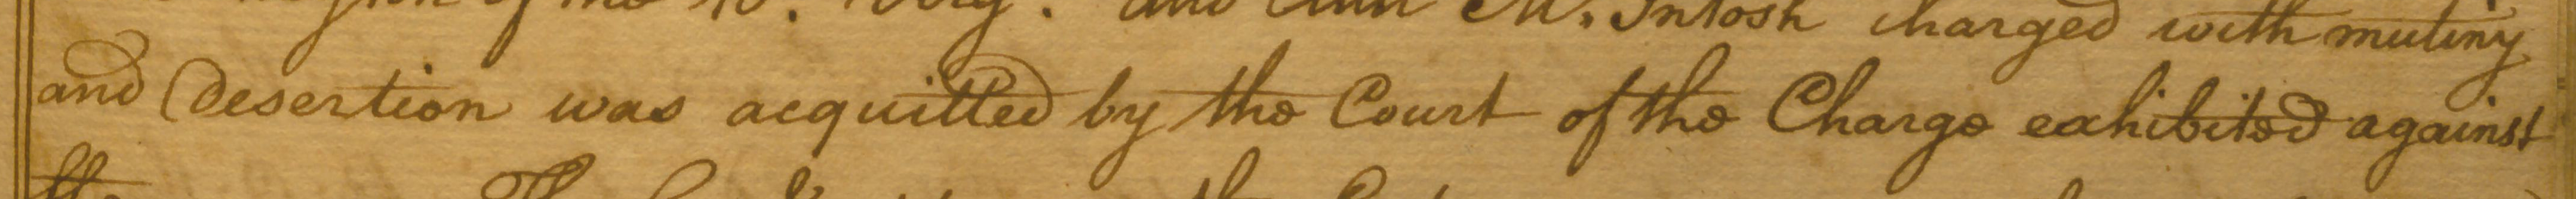and desertion was acquitted by the Court of the Charge exhibited against
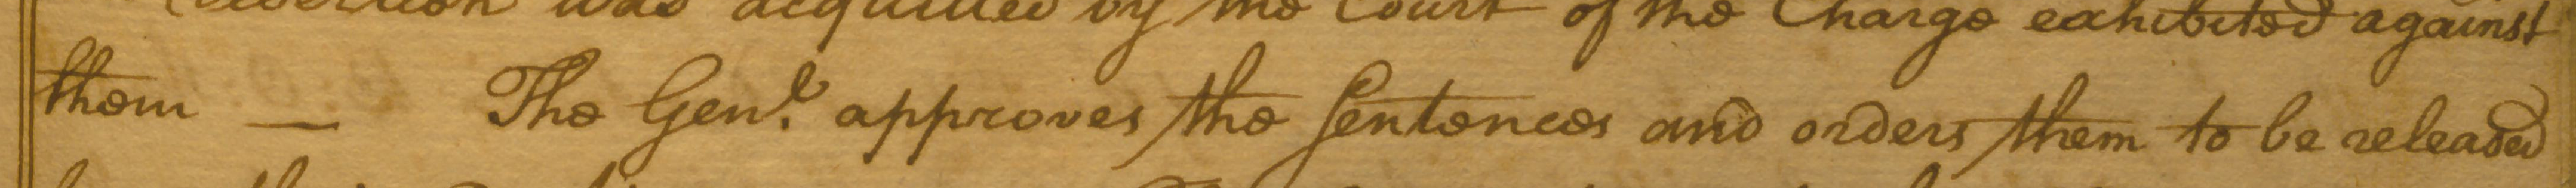them- The Gen^l. approves the sentences and orders them to be released
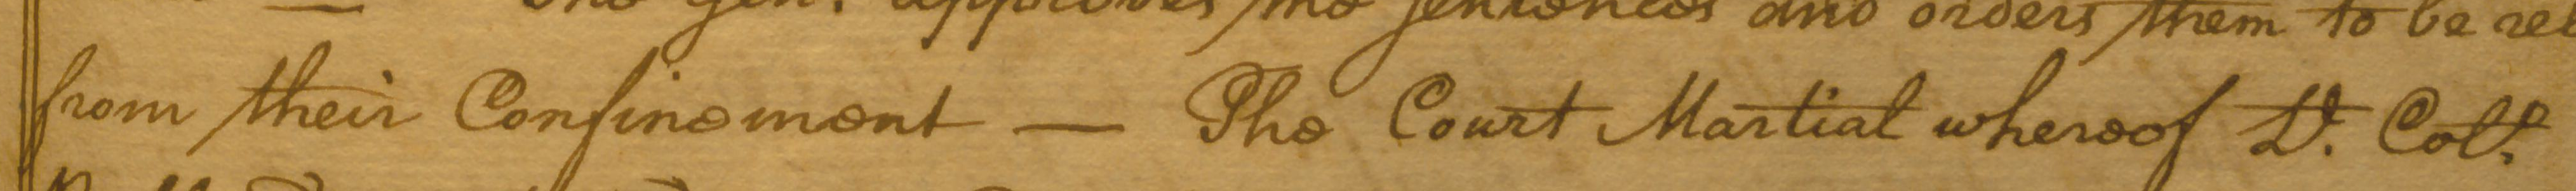from their Confinement- The Court Martial whereof L^t. Col^o.
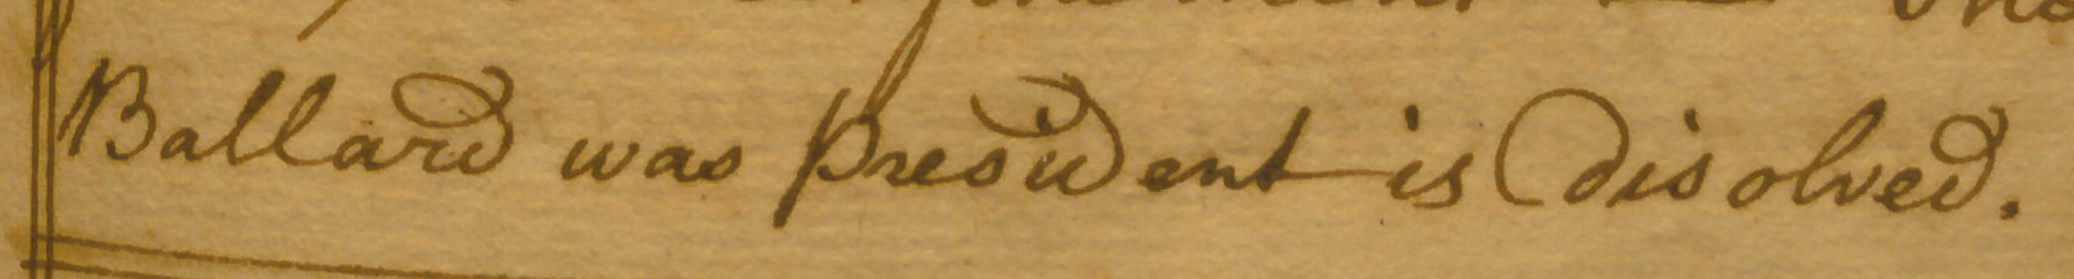Ballard was president is disolved.
